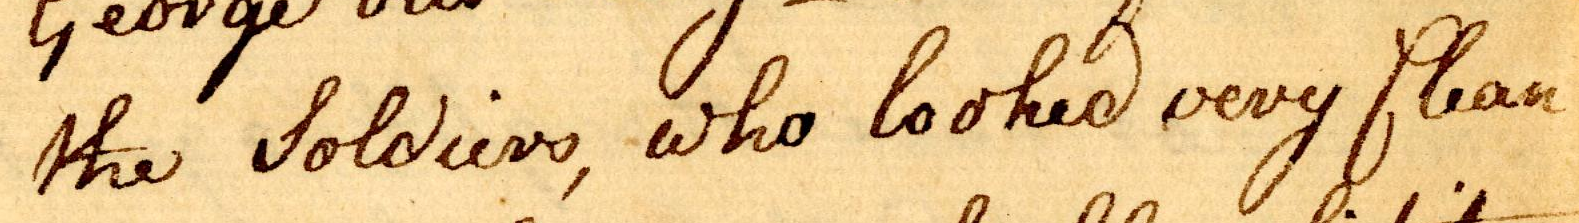the Soldiers, who looked very Clean
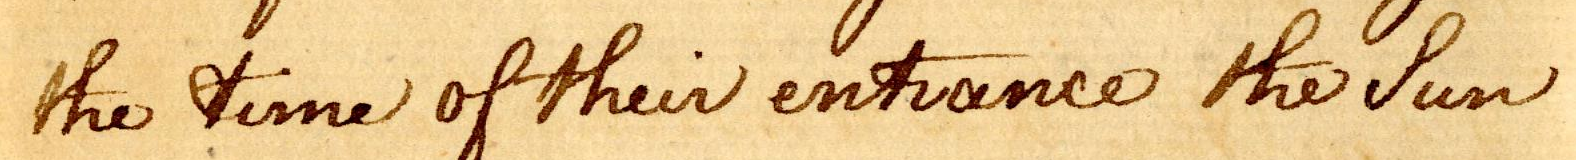the time of their entrance the Sun
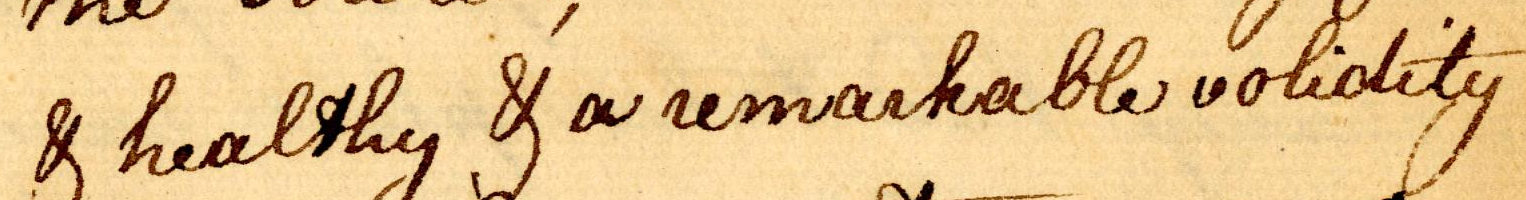& healthy & a remarkable solidity
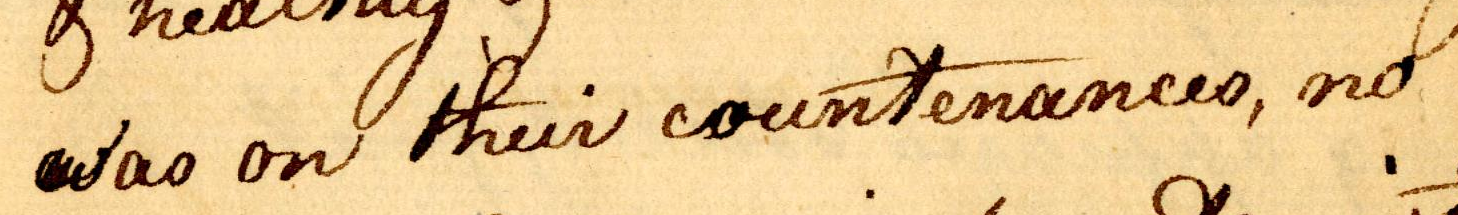was on their countenances, no
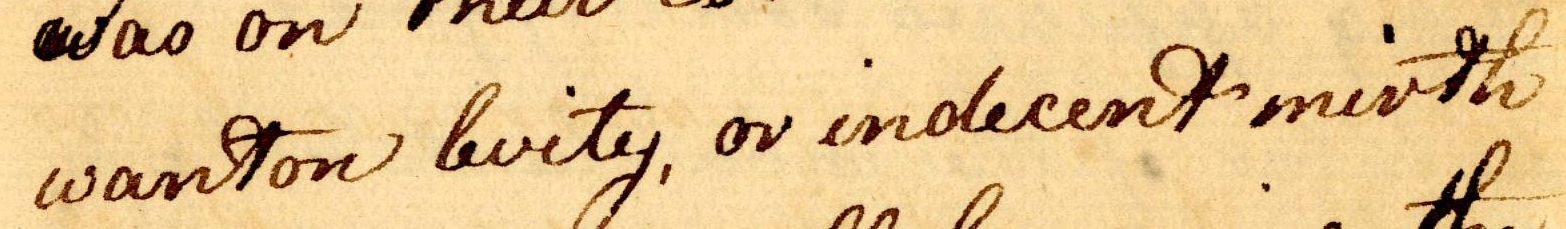wanton levity or indecent mirth
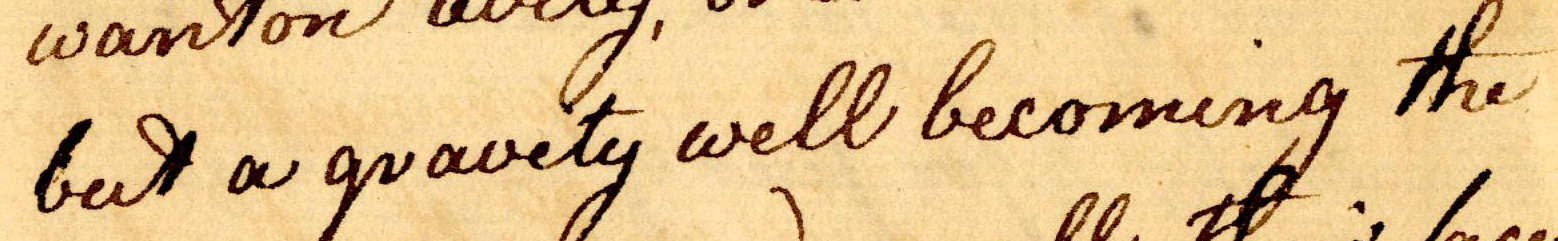but a gravity well becoming the
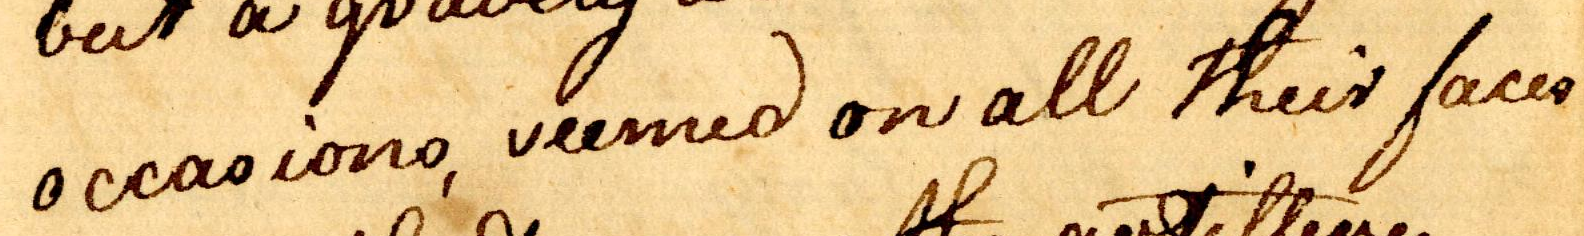occasions seemed on all their faces
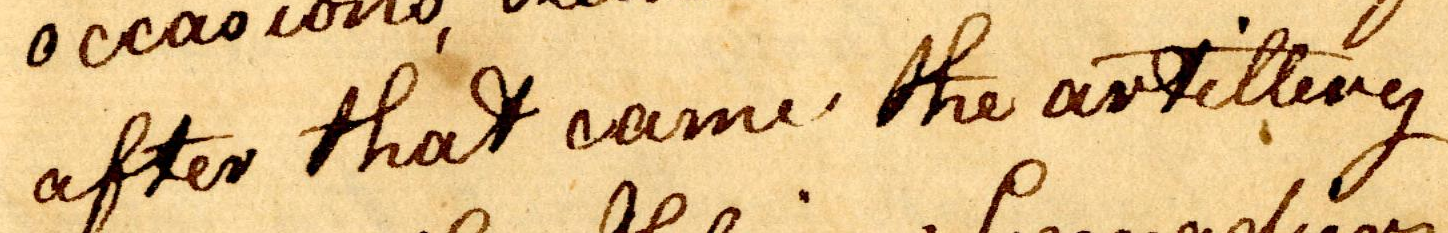after that came the artillery
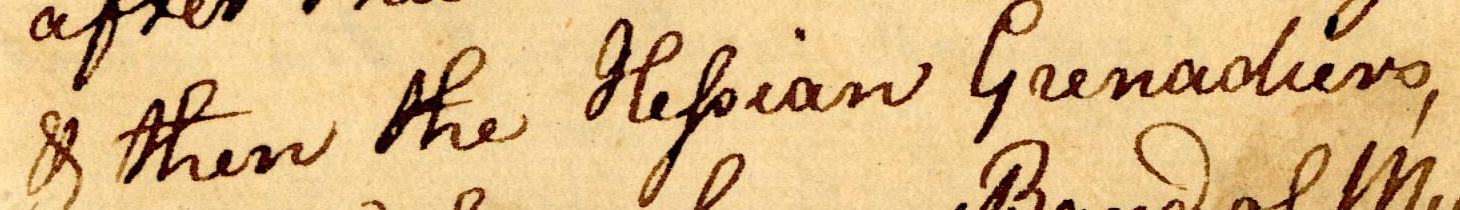& then the Hessian Grenadiers,
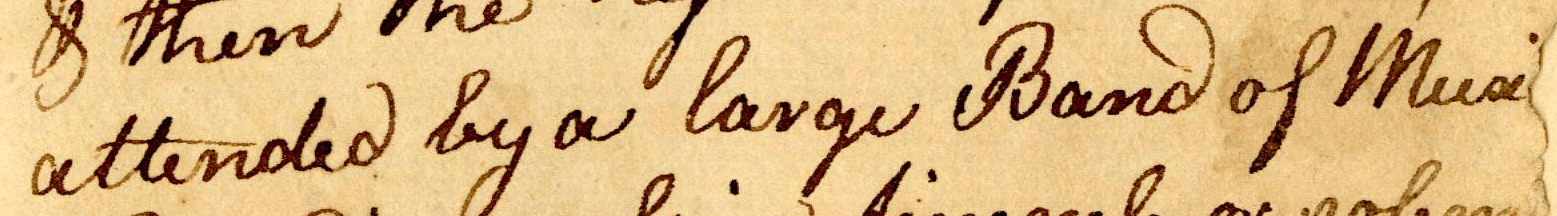attended by a large Band of Musi
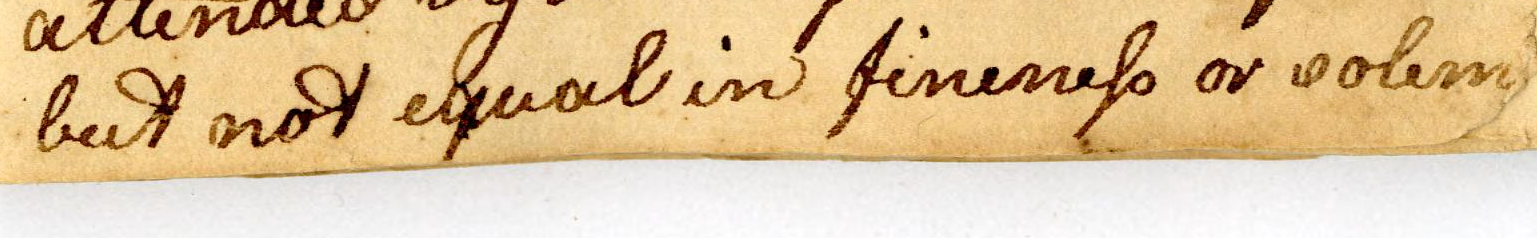but not equal in fineness or solem
